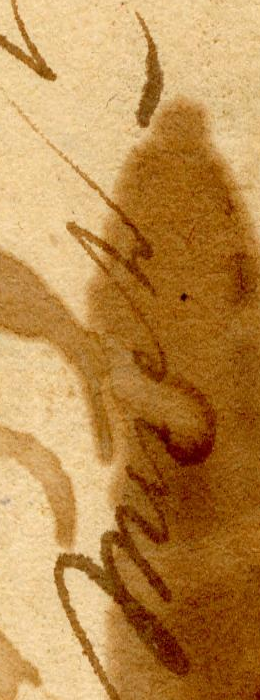Merch^t
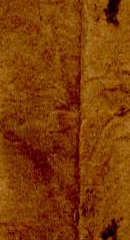In
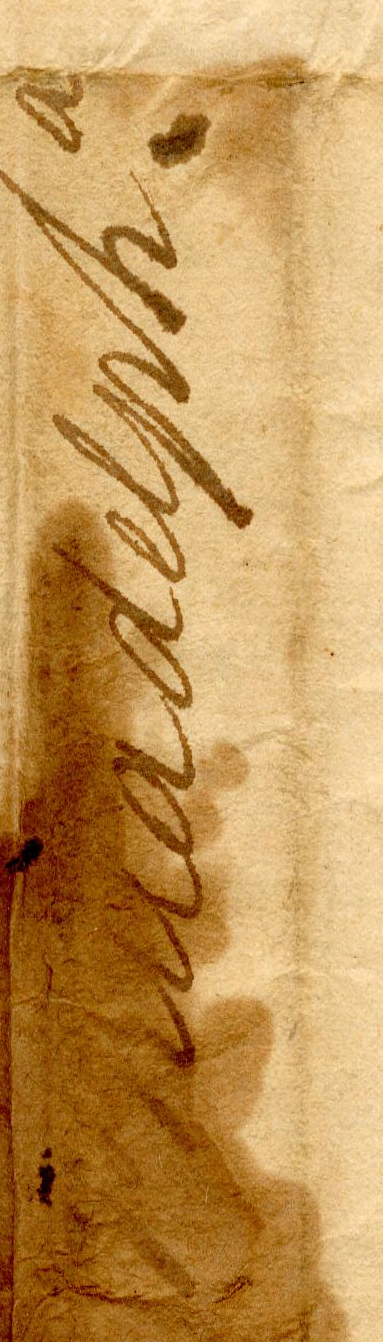Philadelphia
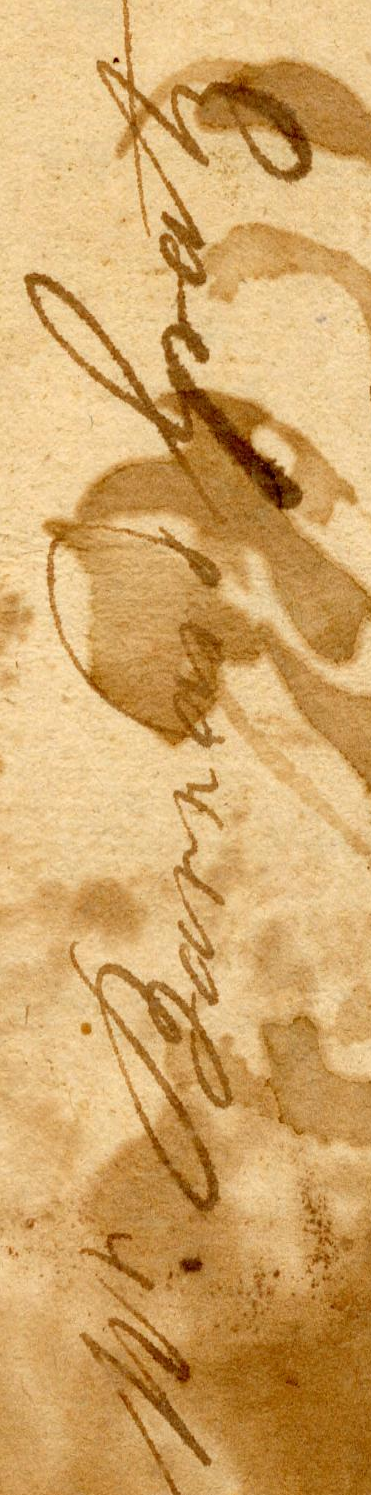M^r Barnard Gratz
